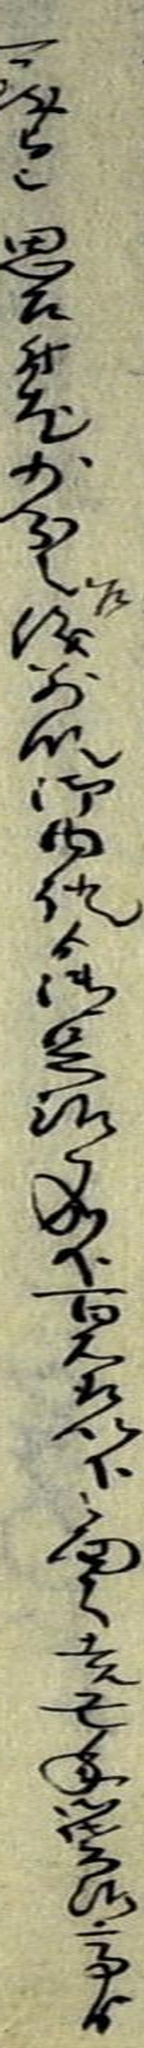可致旨被思召付尤少分之乍儀別段御内証ゟ御足銀被成下百石取以下之面々へ去ル丑年御貸銀高ゟ
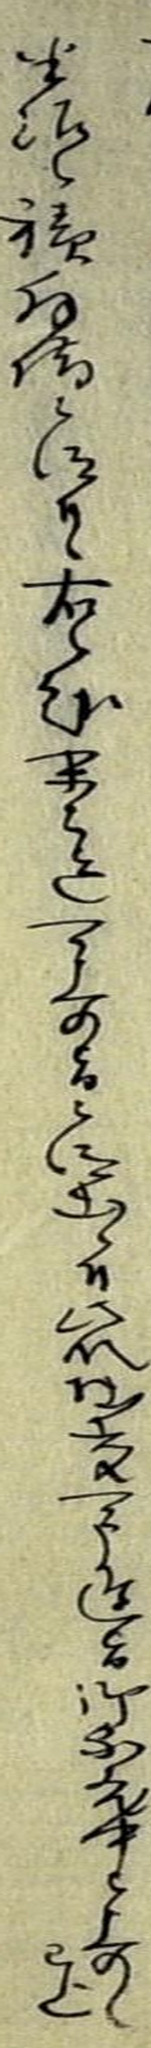半銀之積拝借被仰付候右之趣末々迄可申聞旨被仰出候付此段拙者共可申達旨御家老中被申聞候已上
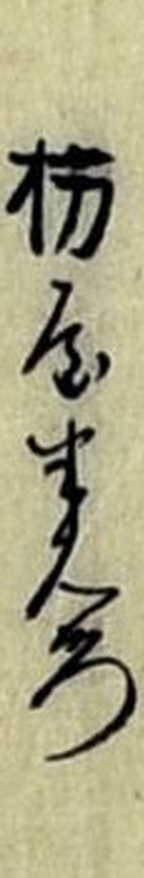栃屋半右衛門
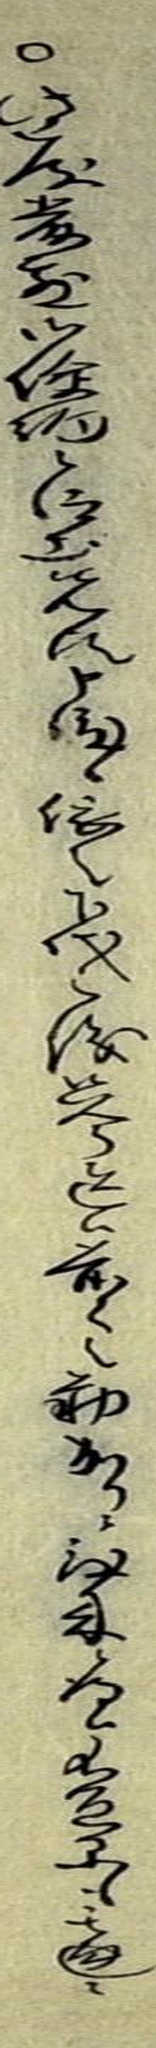〇此度厳敷御倹約被仰出先頃申渡候依之下代之儀只今迄ハ前々之勤成りニ致来候得ハ不宜品も其通ニ
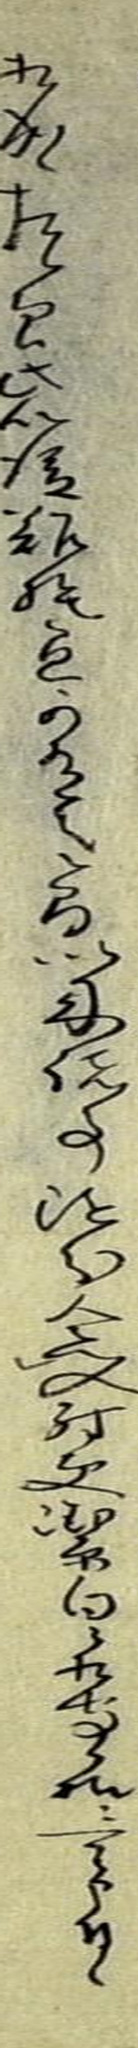相成候左候而ハ此以後難捨置可有之候間以来諸事随分念入殊更潔白ニ相守候様ニ可申付候
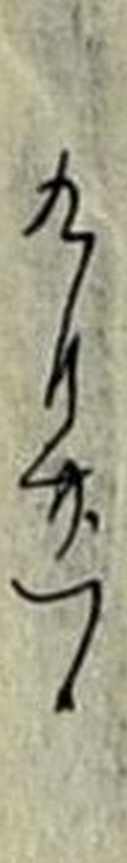九月廿一日
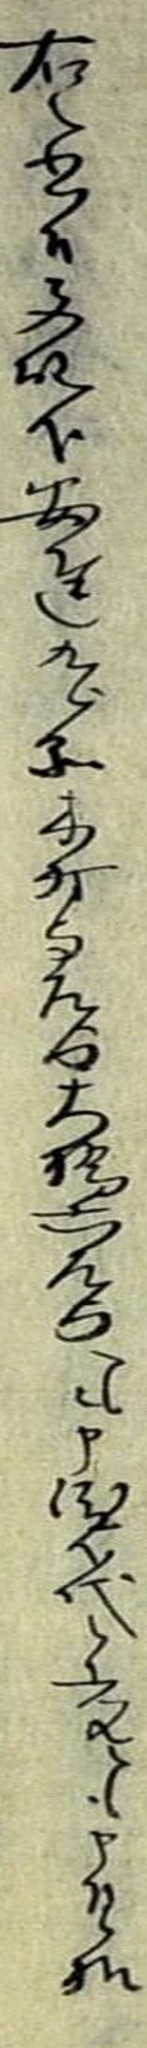右之書付支配下安達九郎兵衛木村与左右衛門大橋六左衛門へも申渡下代之者共へも申付候様
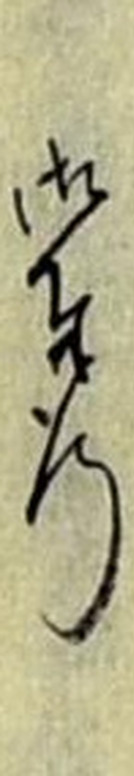御奉行
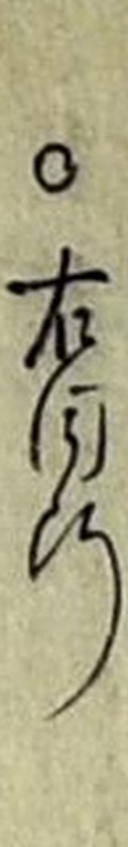〇右同断
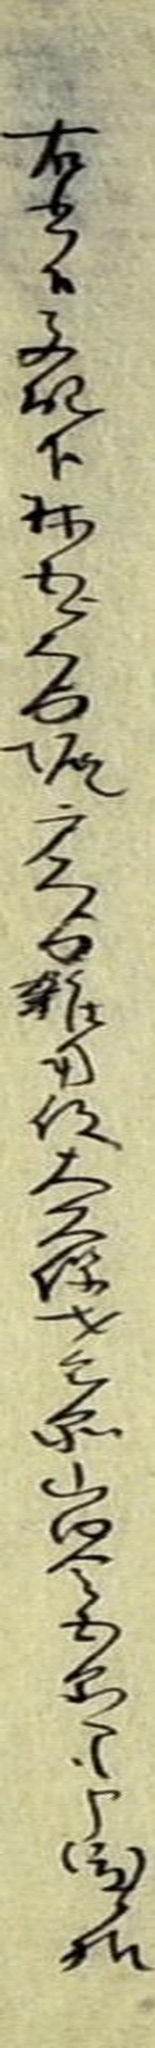右書付支配下林五郎右衛門堀庄右衛門雑用役大久保才兵衛山内金五兵衛へも申渡候様
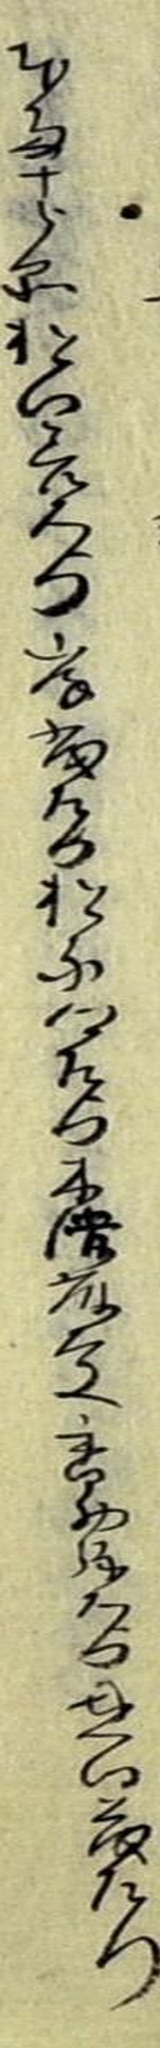本多十郎兵衛松田善右衛門岸茂左衛門松永郷左衛門木滑藤大夫香西弥右衛門恩田茂左衛門

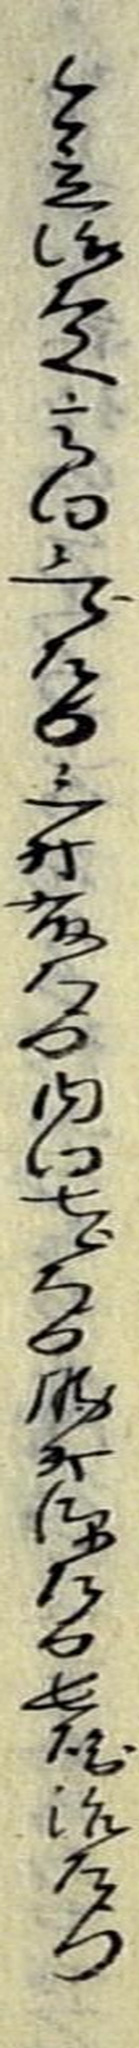今立治大夫高田三郎左衛門三村藤右衛門内田七郎右衛門勝村源左衛門長嶋治左衛門
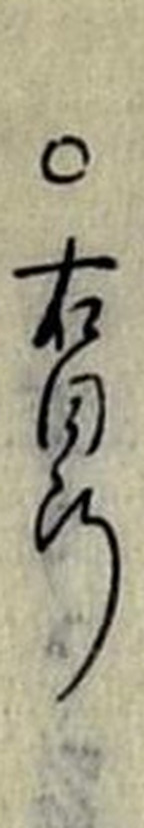〇右同断
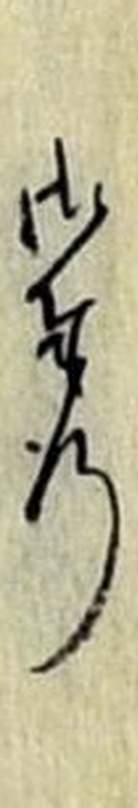御奉行
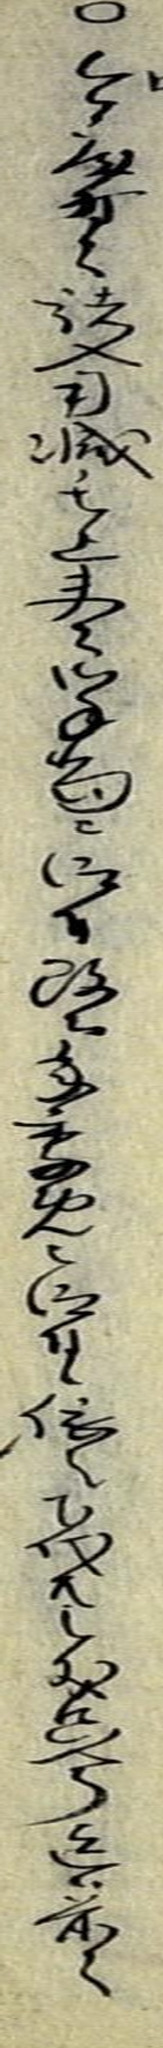〇今此度村々諸入用減其上夫々御手当被仰付改而年季免被仰付候依之下代共之義只今迄ハ前々
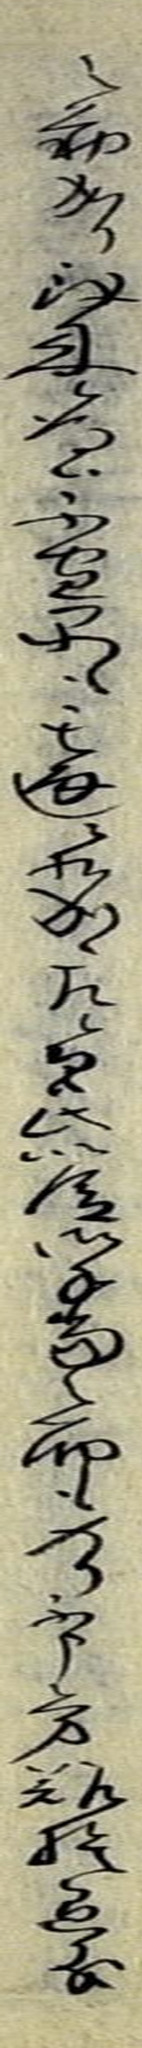之勤成り致来候得ハ不宜品も其通ニ相成候左候而ハ此以後御手当之筋も〆り不申旁難捨置義
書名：命令之部 一
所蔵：福井県文書館 Fukui Prefectural Archives
